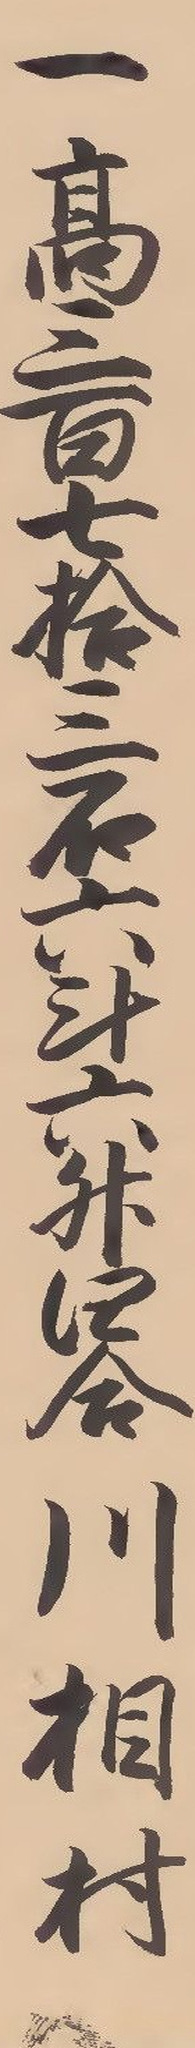一高三百七拾三石六斗六升四合川相村
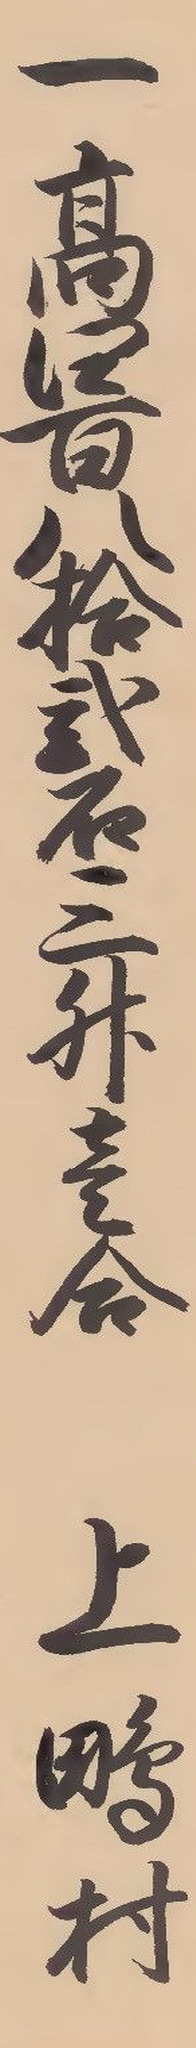一高四百八拾弐石三升壱合上鴫村
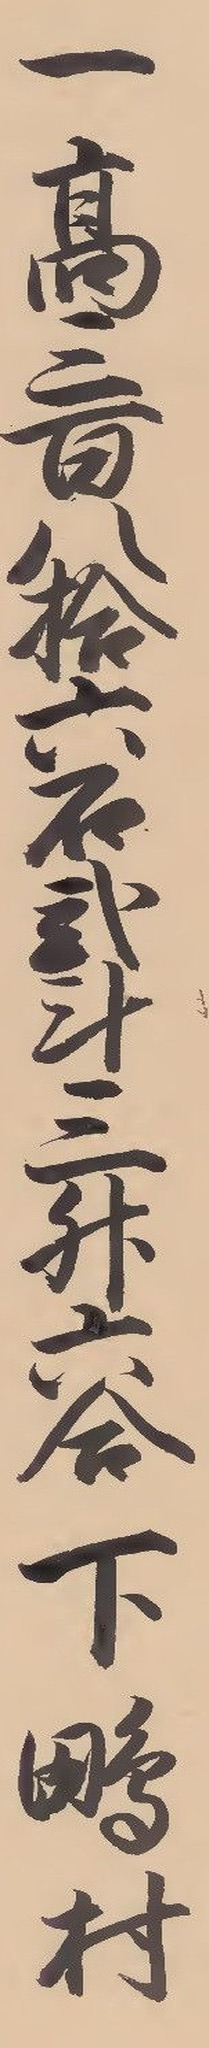一高三百八拾六石弐斗三升六合下鴫村
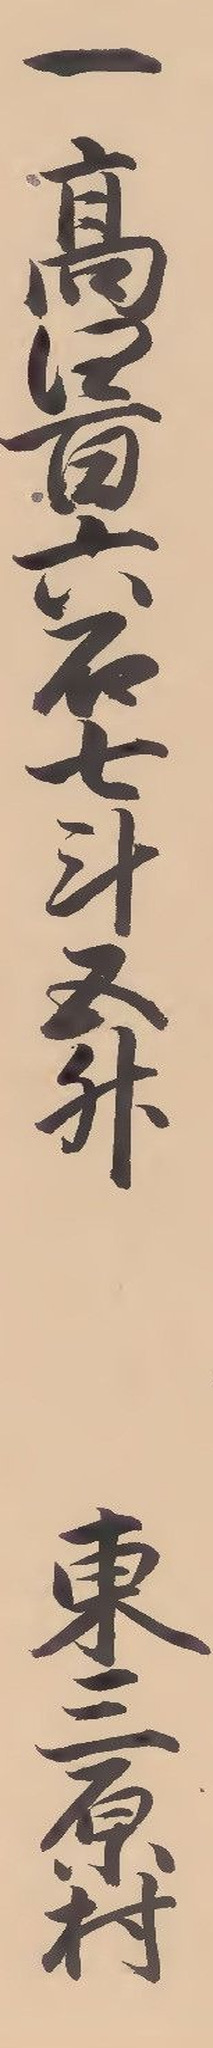一高四百六石七斗五升東三原村

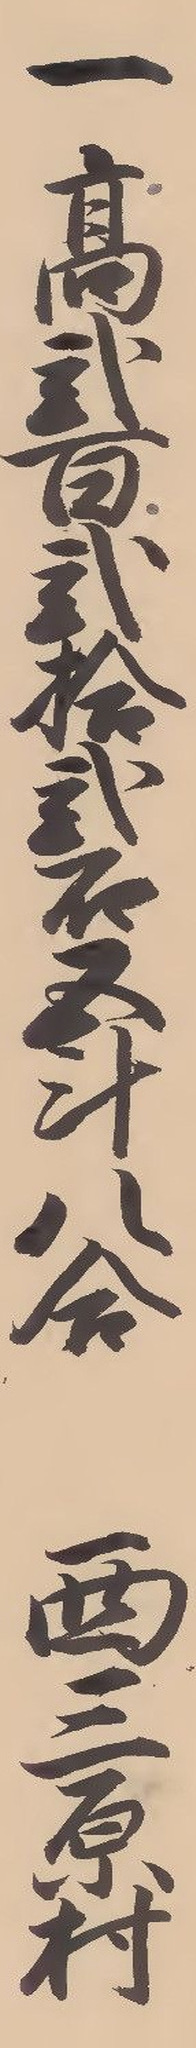一高弐百弐拾弐石五斗八合西三原村
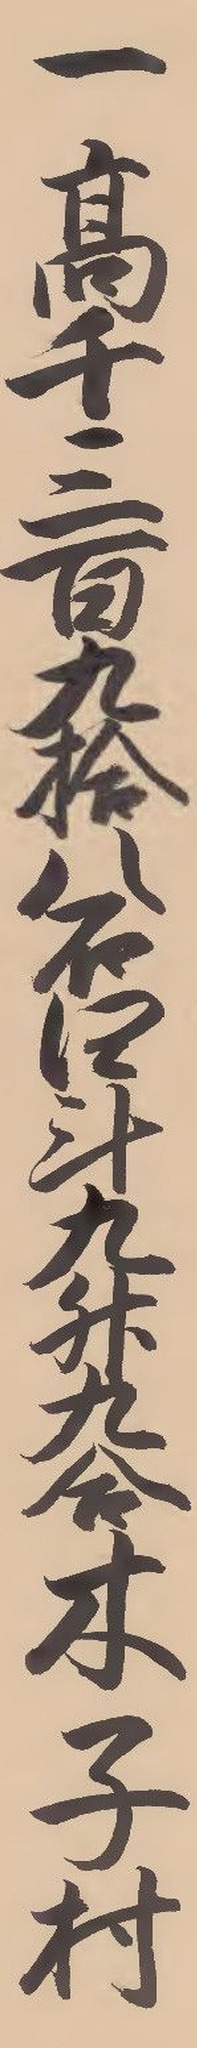一高千三百九拾八石四斗九升九合木子村
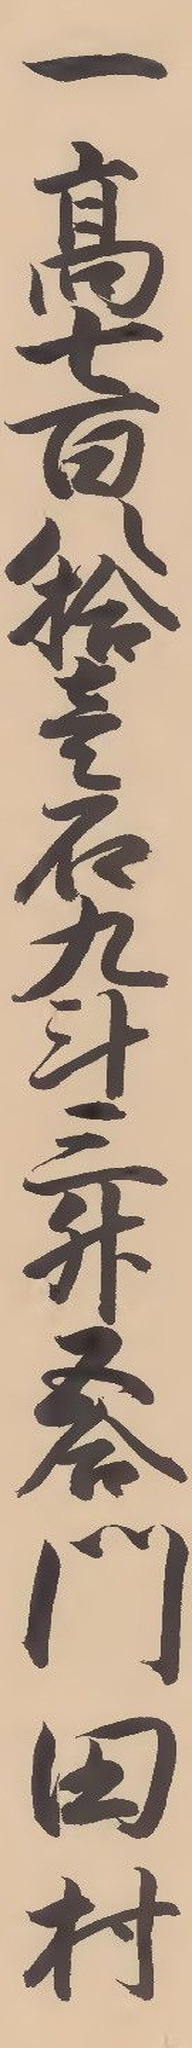一高七百八拾壱石九斗三升五合門田村
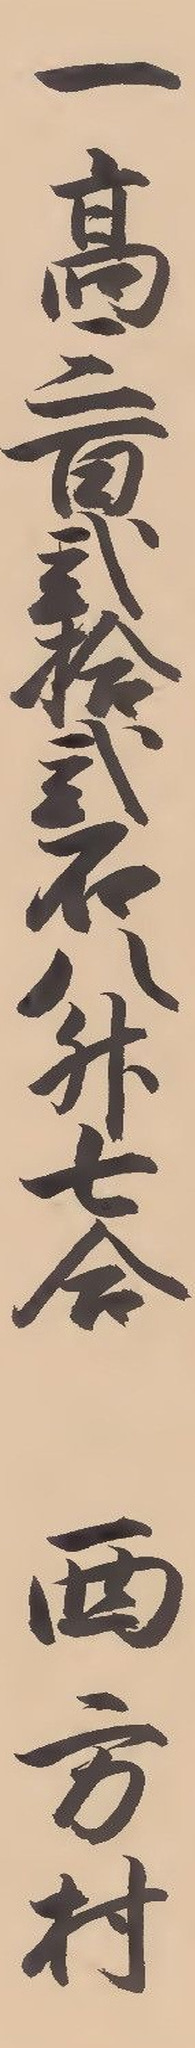一高三百弐拾弐石八升七合西方村
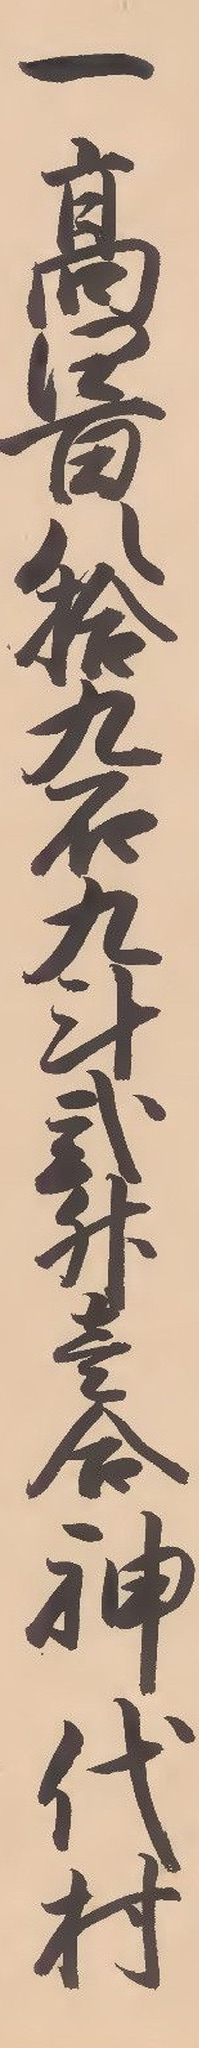一高四百八拾九石九斗弐升壱合神代村
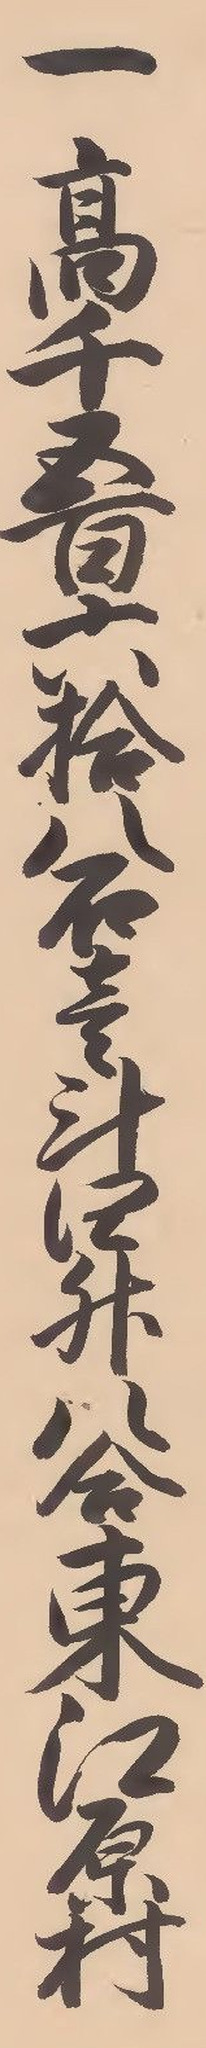一高千五百六拾八石壱斗四升八合東江原村
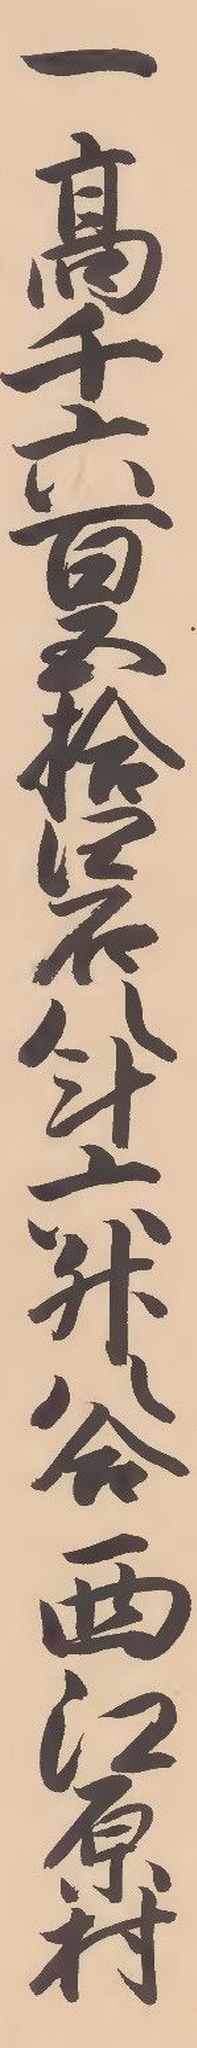一高千六百五拾四石八斗六升八合西江原村
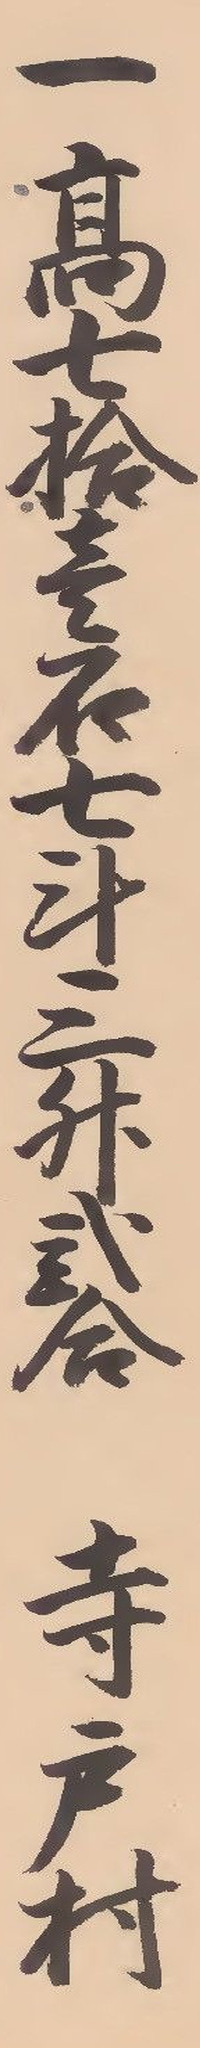一高七拾壱石七斗三升弐合寺戸村

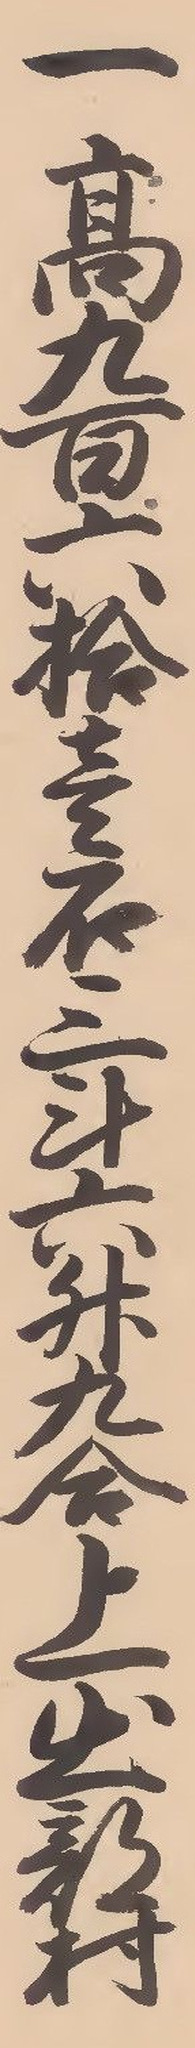一高九百六拾壱石三斗六升九合上出部村
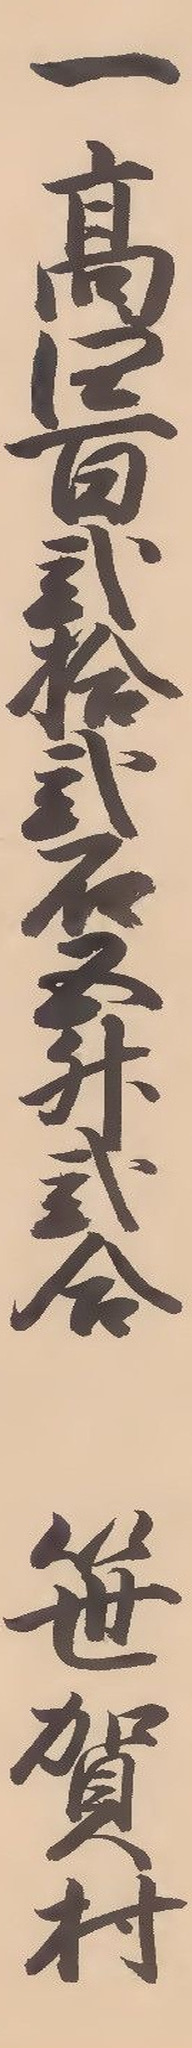一高四百弐拾弐石五升弐合笹賀村
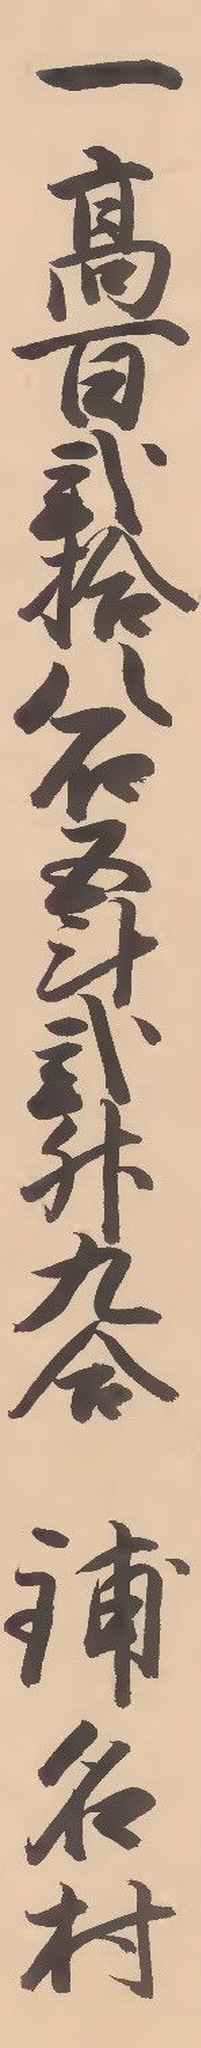一高百弐拾八石五斗弐升九合鋪名村
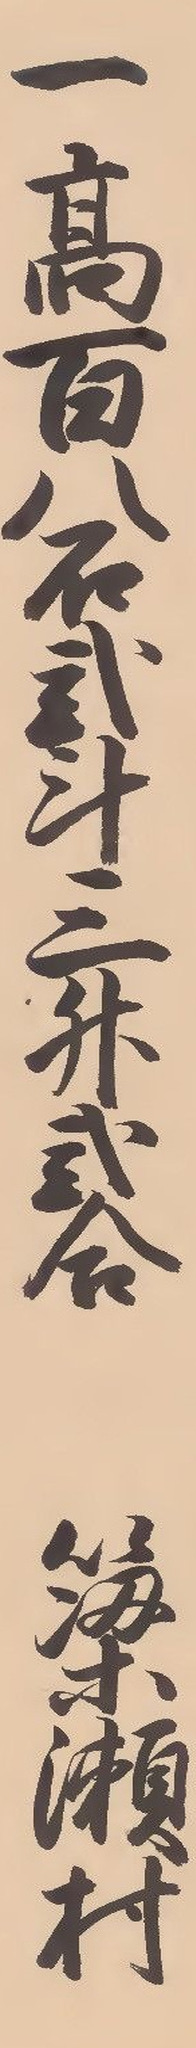一高百八石弐斗三升弐合簗瀬村
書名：備中国郷帳
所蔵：国立公文書館 National Archives of Japan
